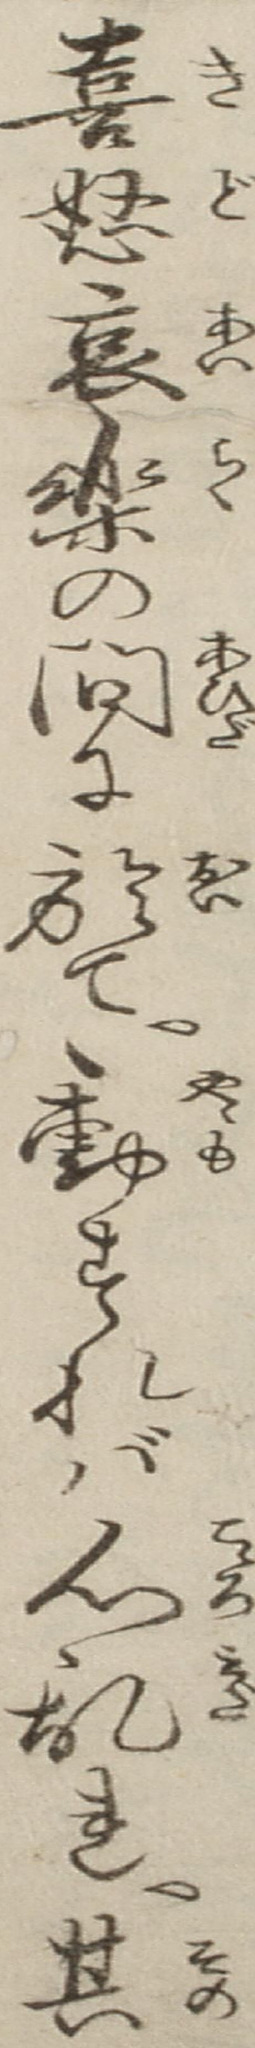喜怒哀楽の間に於て。動すれば心乱れ。其
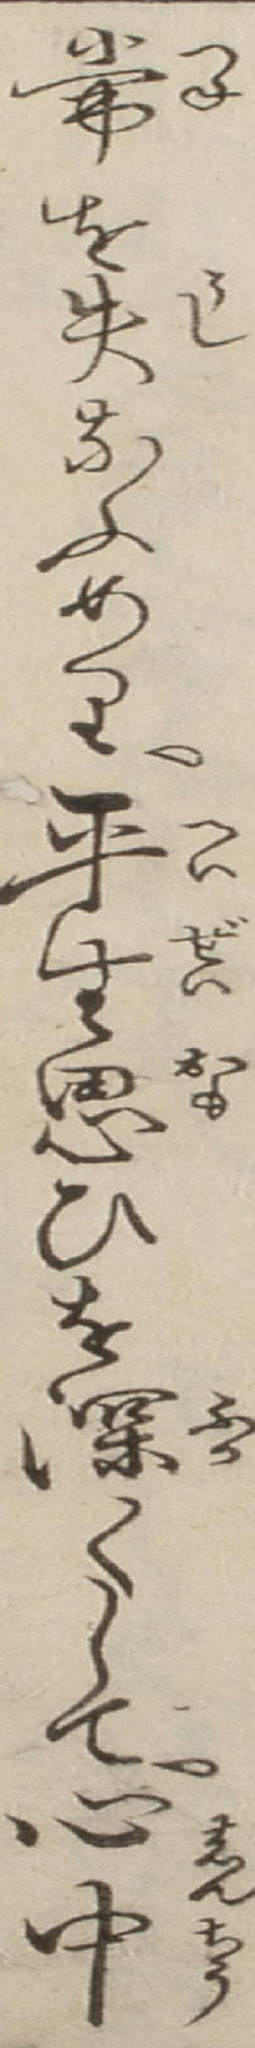常を失なふめり。平生思ひを深くして。心中
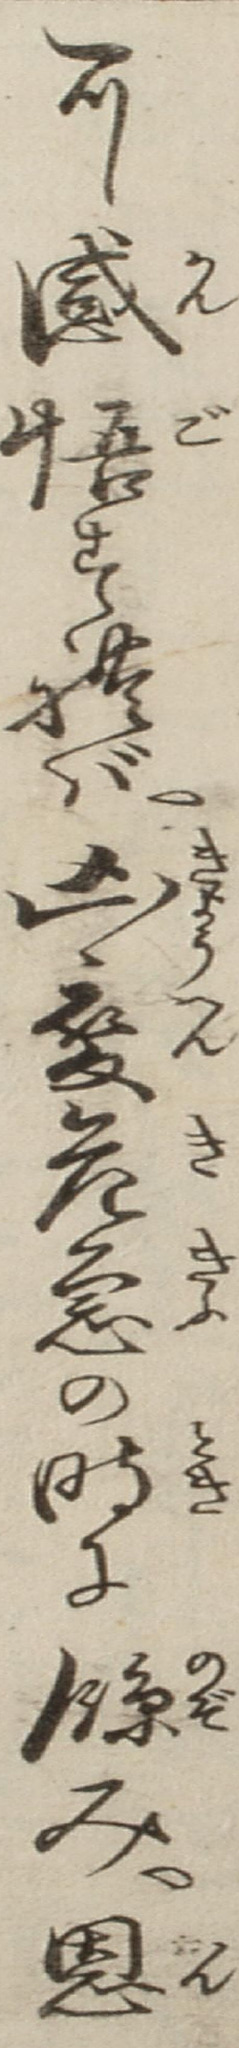にし感悟すれば。凶変危急の時に臨み。恩
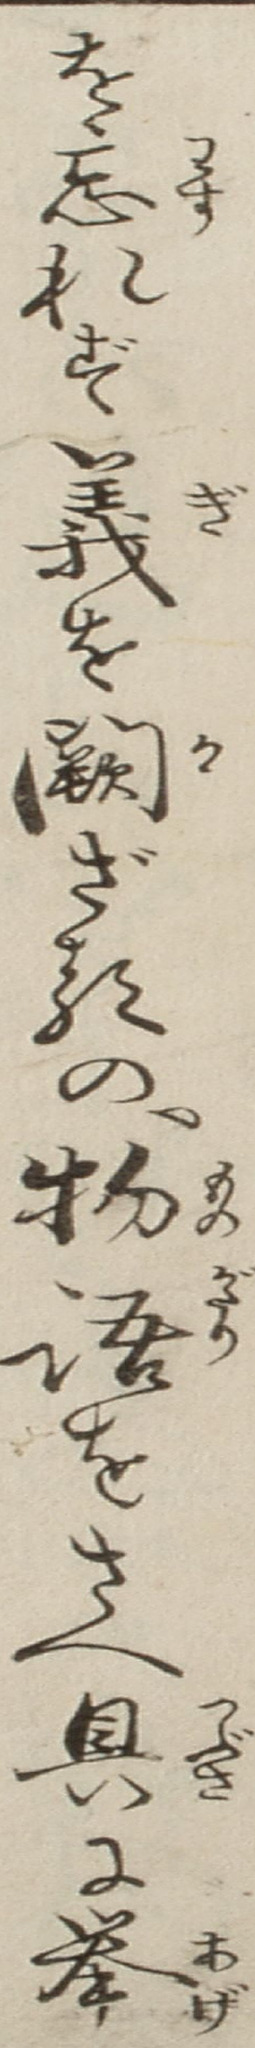を忘れず義を闕ざるの。物語をさへ具に挙
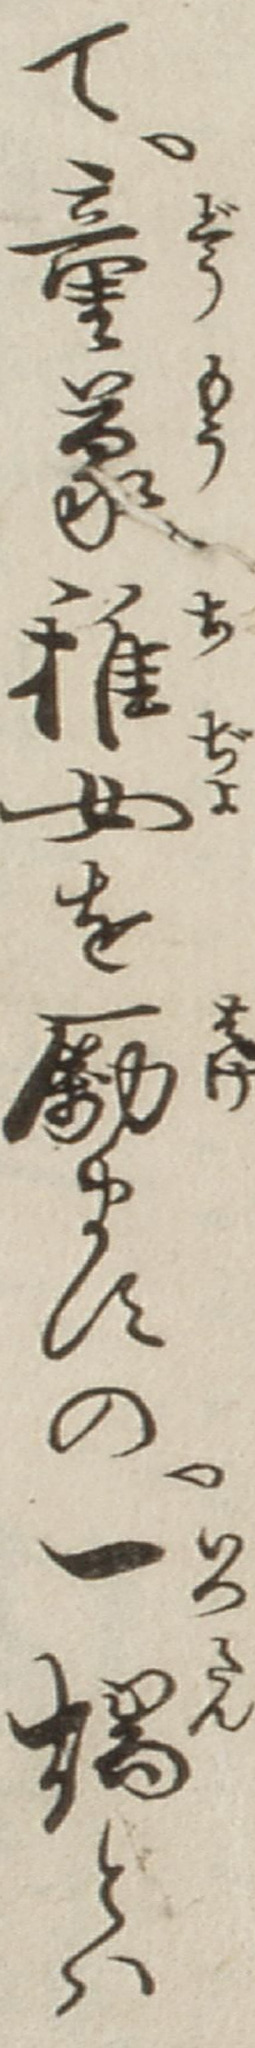て。童蒙稚女を励ますの。一端とは
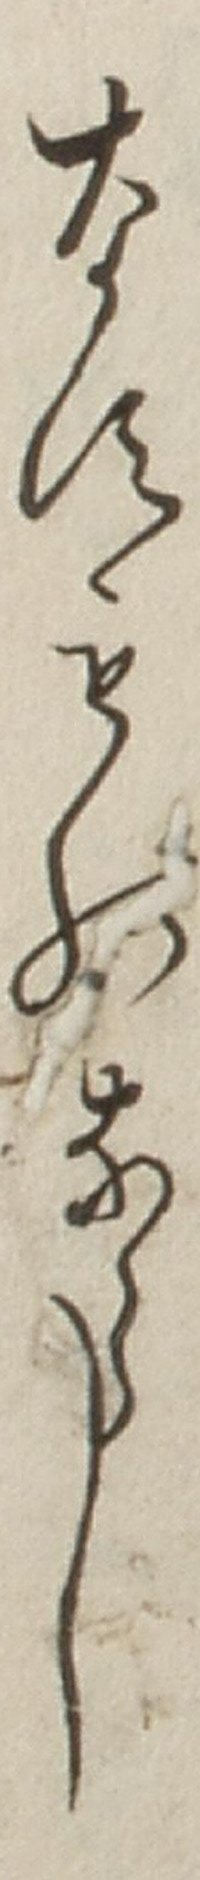なすものならし
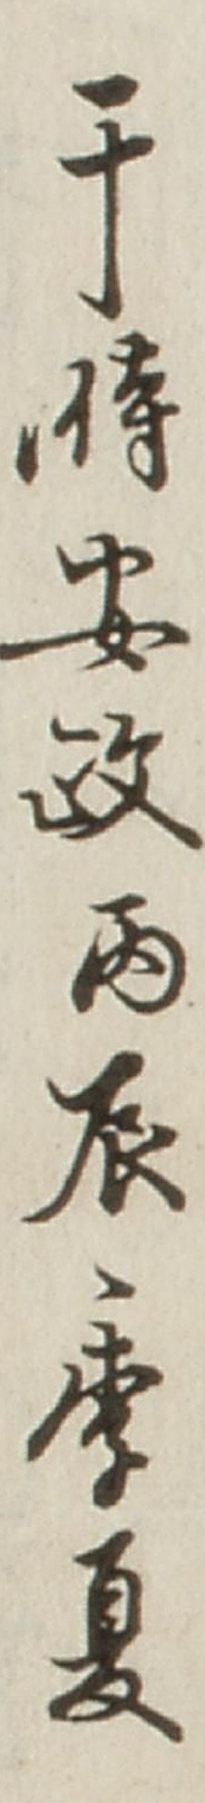于時安政丙辰季夏

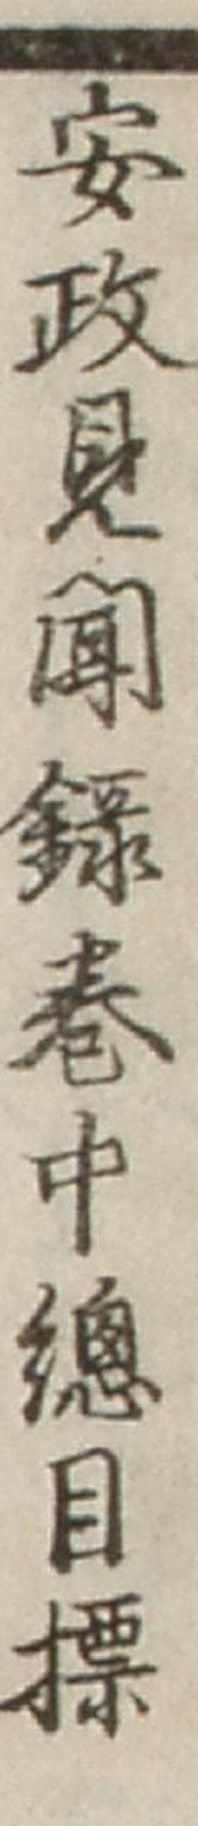安政見聞録巻中総目標
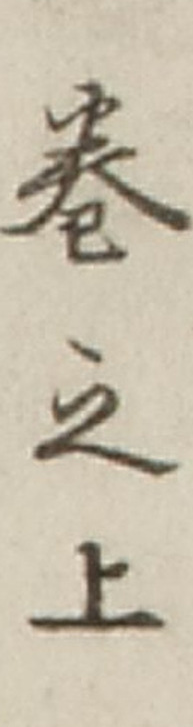巻之上
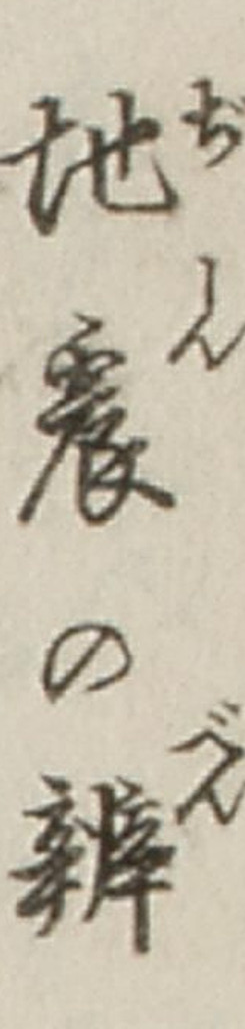地震の弁
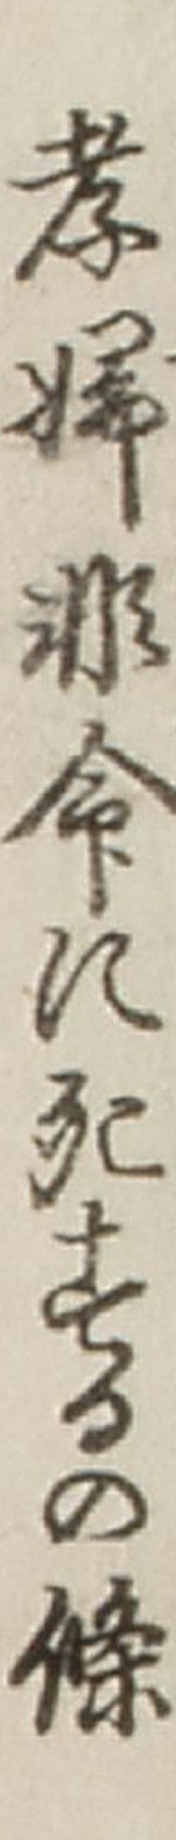孝婦非命に死するの条
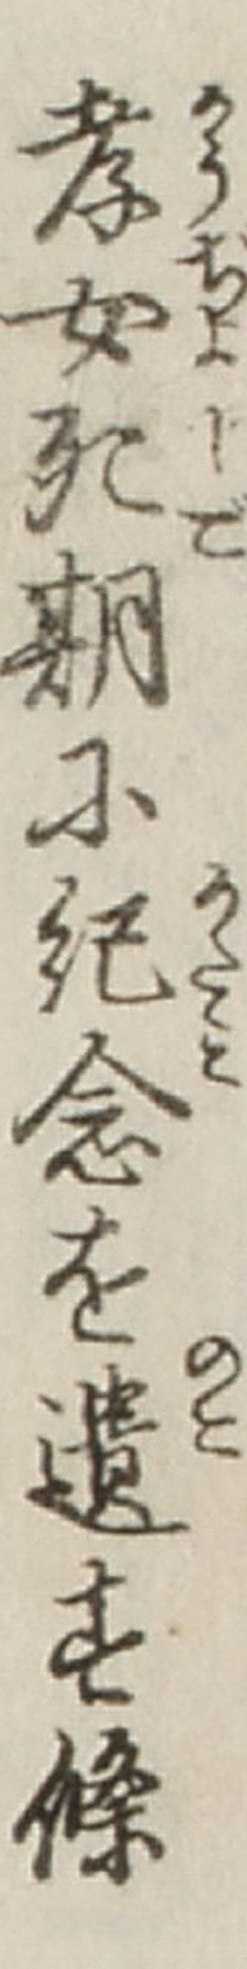孝女死期に紀念を遺す条
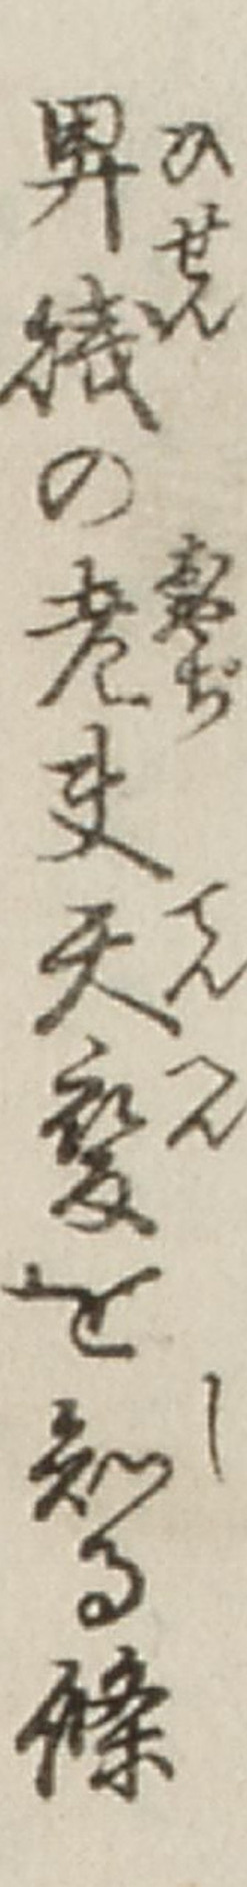卑賎の老夫天変を知る条
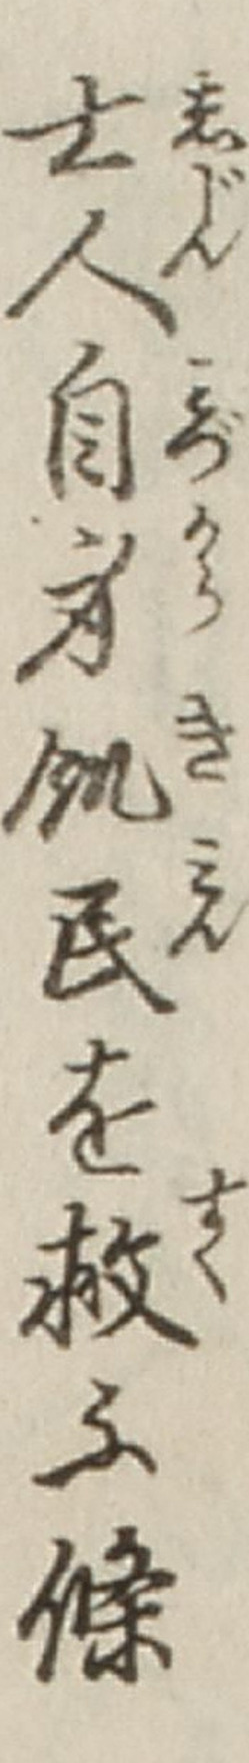士人自身飢民を救ふ条
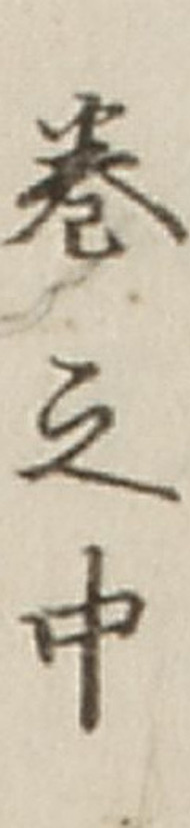巻之中
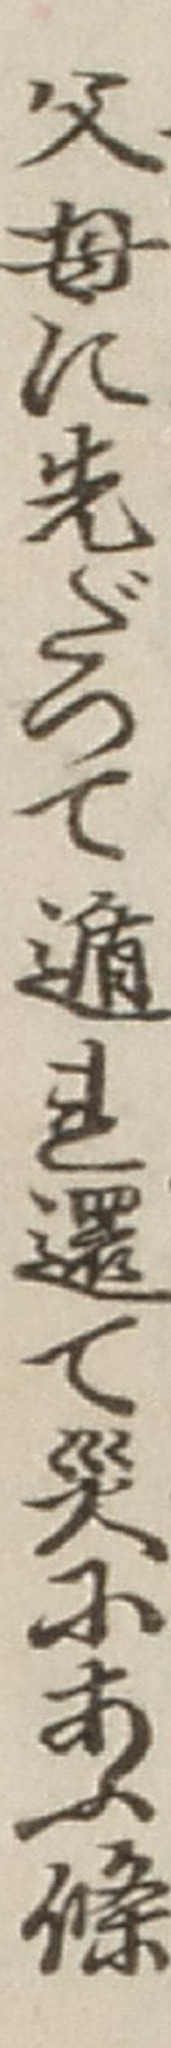父母に先だつて遁れ還て災にあふ条
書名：安政見聞録　上
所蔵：東京大学地震研究所図書室 Earthquake Research Institute Library, The University of Tokyo, JAPAN
